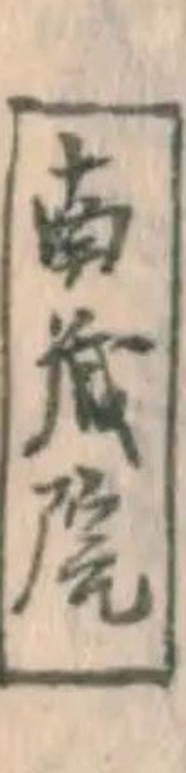南蔵院
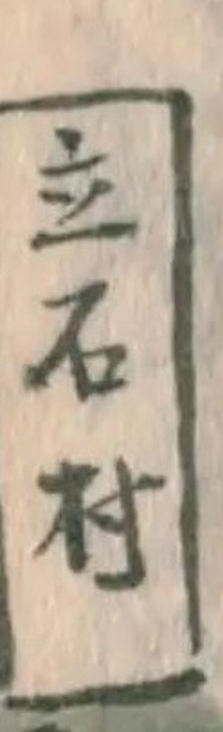立石村

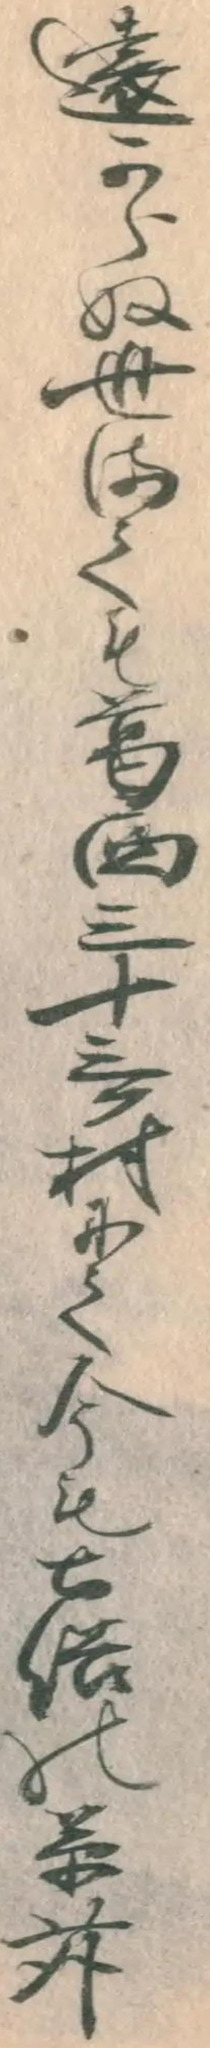遠からぬ世まても葛西三十三ヶ村にて今も土俗の草苅
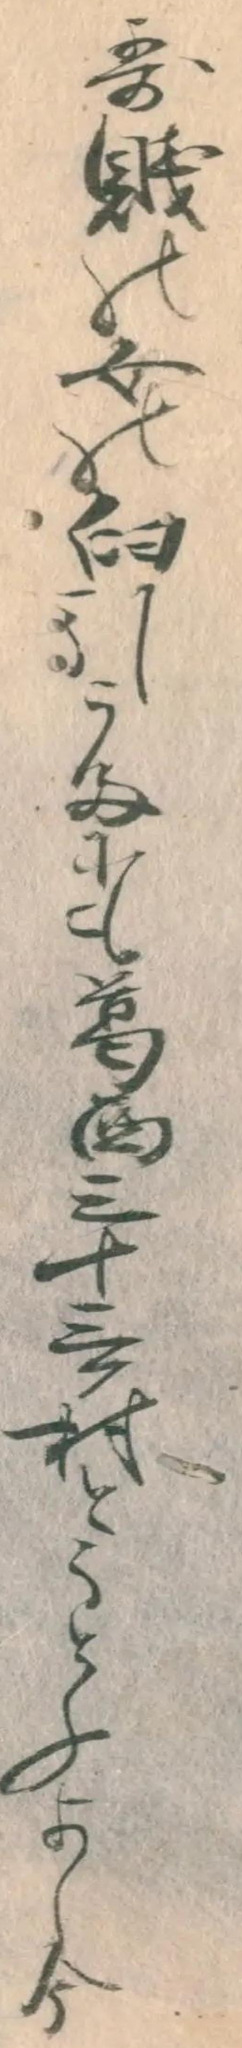哥賤の女の臼引うたにも葛西三十三ヶ村とうとよし今
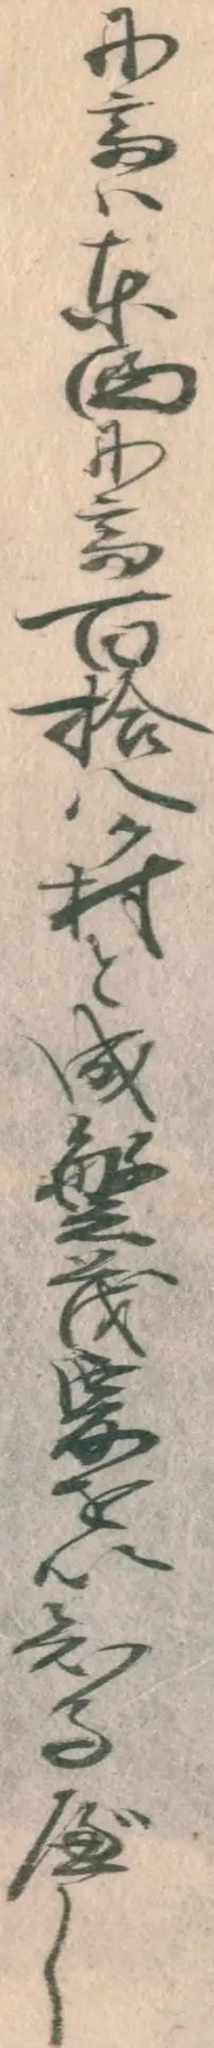にては東西にて百拾八ヶ村と成繁茂爰を以知るべし
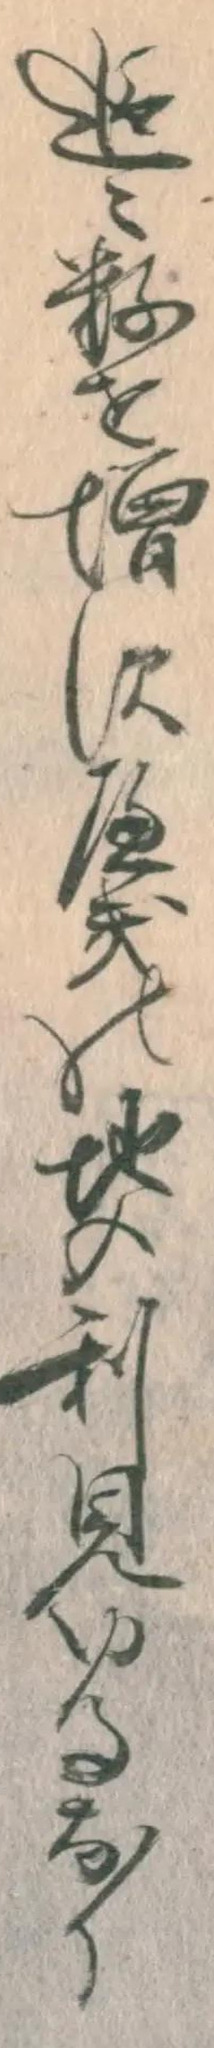追々数を増すへきの地の利見ゆるなり
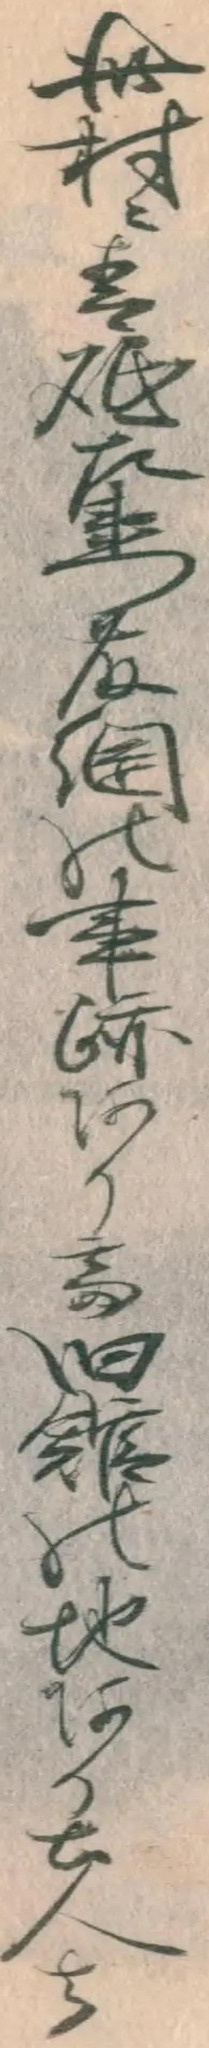此村に青砥左衛門藤網の事跡ありて旧館の地あり土人は
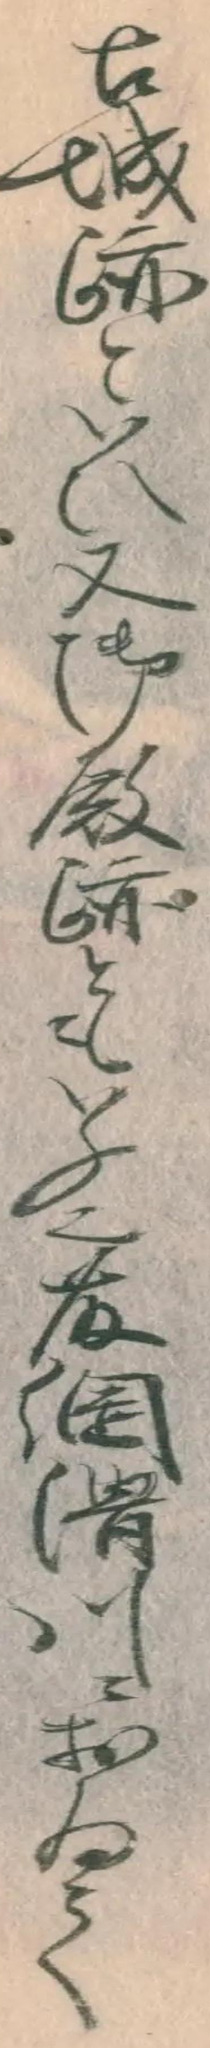古城跡といひ又御殿跡ともいふ也藤綱滑川におゐて
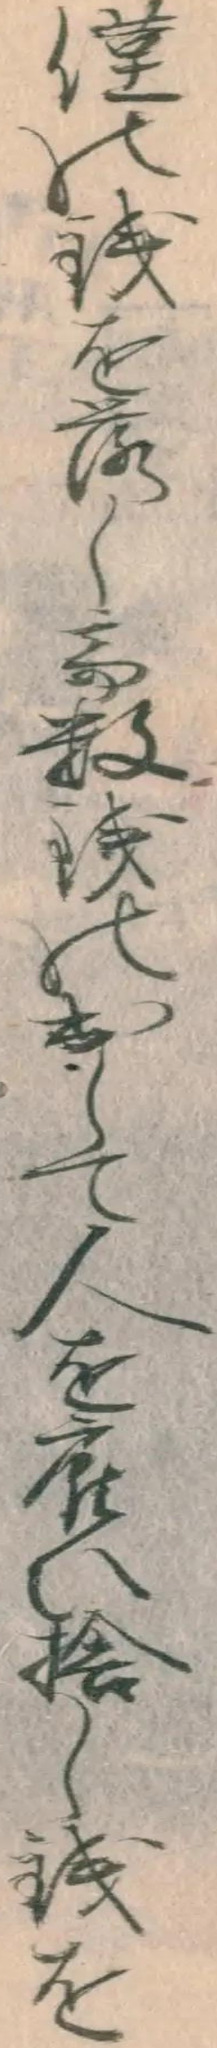僅の銭を落して数銭の出して人を雇ひ捨し銭を
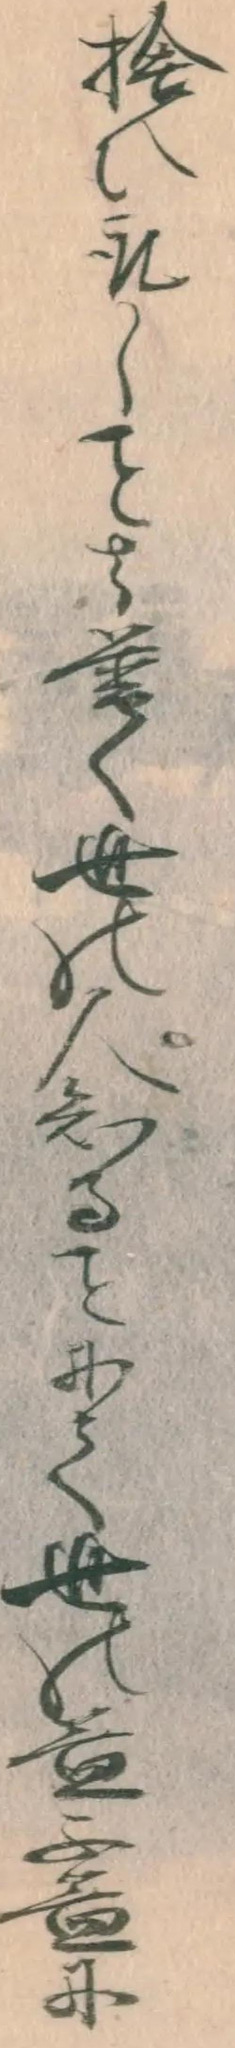拾ひ取しことは普く世の人知ることにて世の益不益に
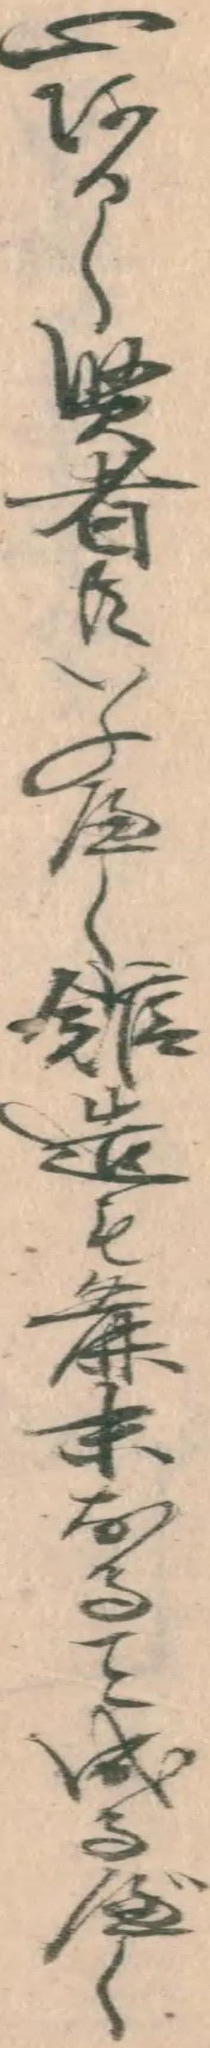やあるし賢者共いふへし館造も麁末なること成るべし
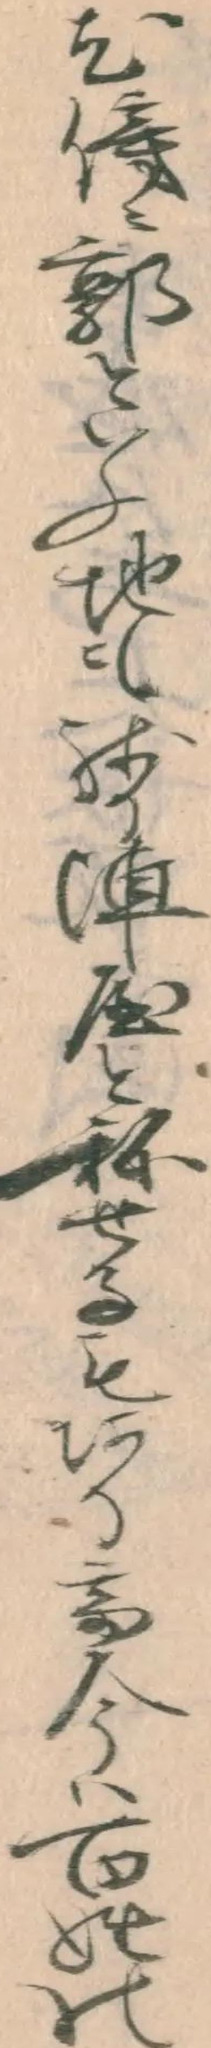尤傍に郭といふ地も残り陣屋と称せるもありて今は百姓の
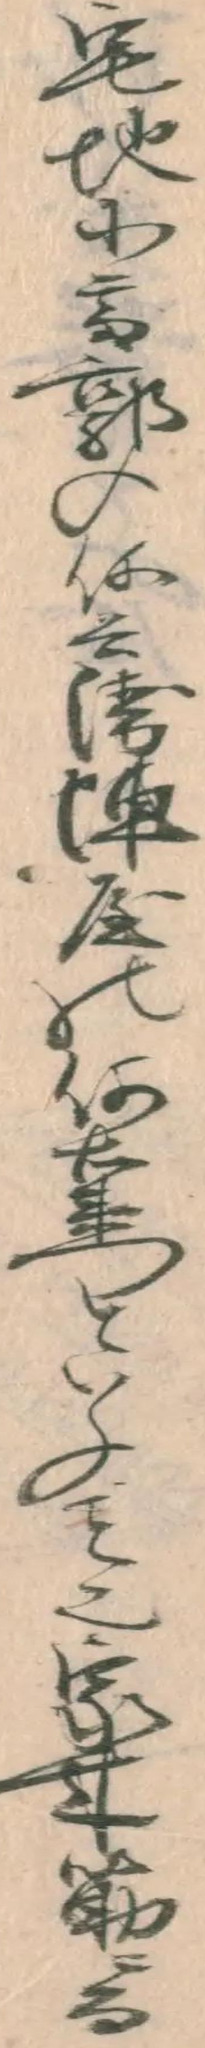宅地にて郭の何兵衛陣屋の何右衛門といふこと也家来筋にて
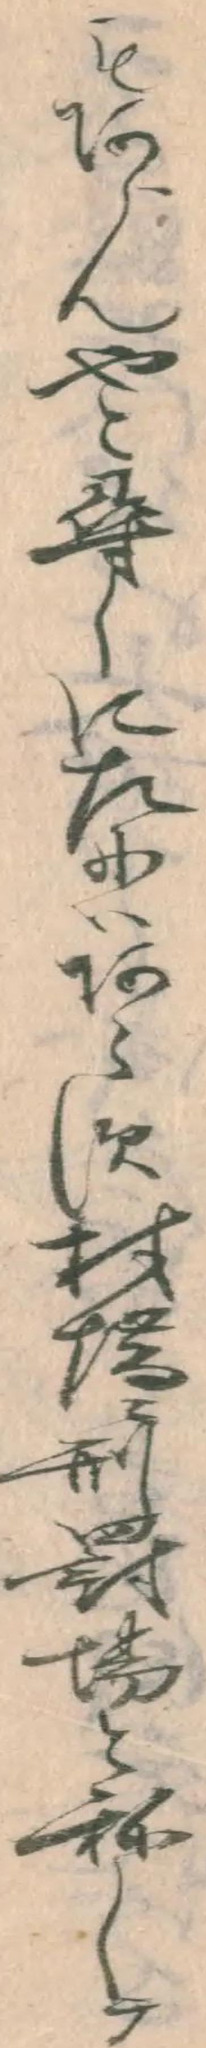もあらんやと尋しに左にはあらす村端に刑罰場と称して
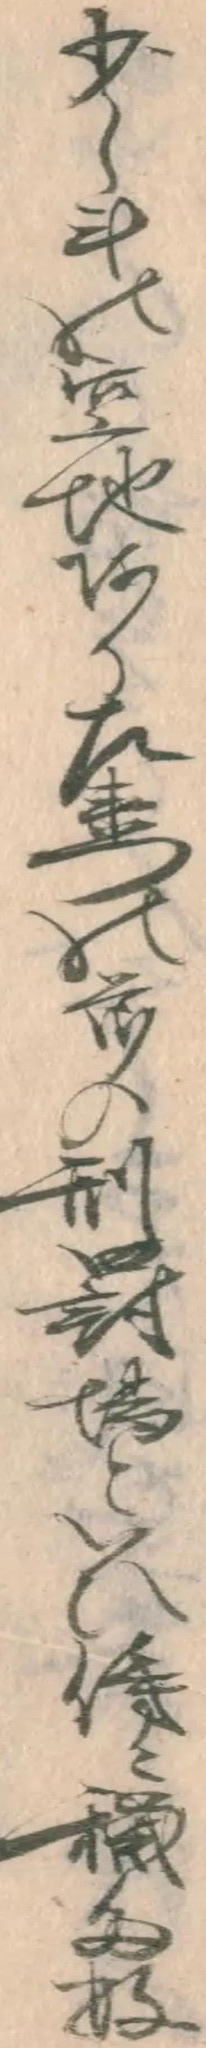少し斗の空地あり左衛門の節の刑罰場といひ傍に穢多数
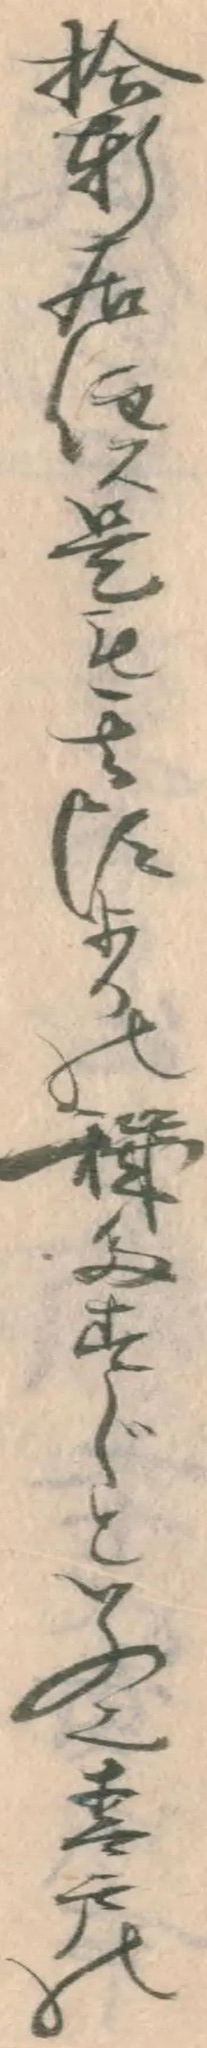拾軒居住す是も其頃よりの穢多すじといふ也青戸の
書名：四神地名録 6巻. [4]葛飾郡
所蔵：国立国会図書館 National Diet Library, JAPAN
